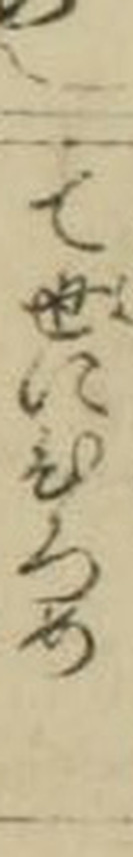て世にひろめ
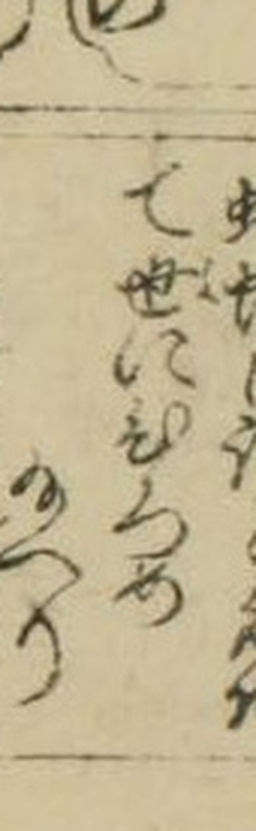給へり
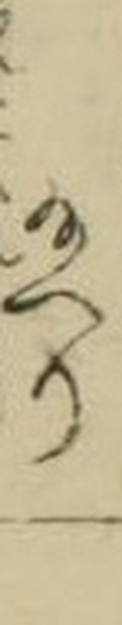給へり
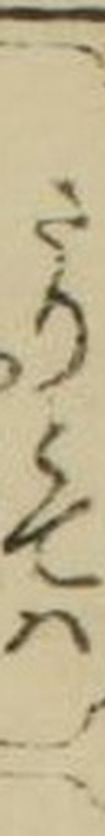さりとては
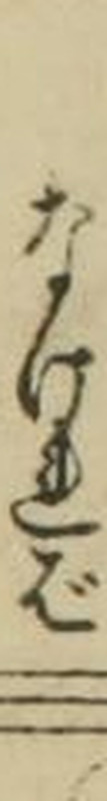なければ
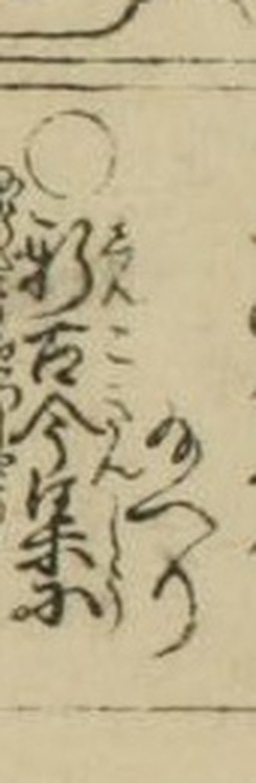◯新古今集に
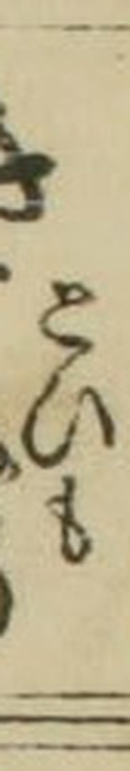とひも
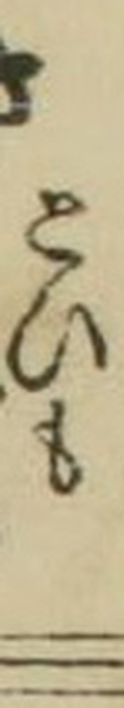とひも
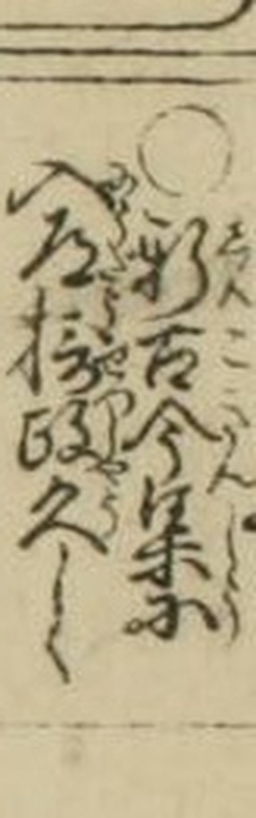入道摂政久しく
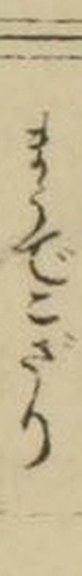まうでこざり
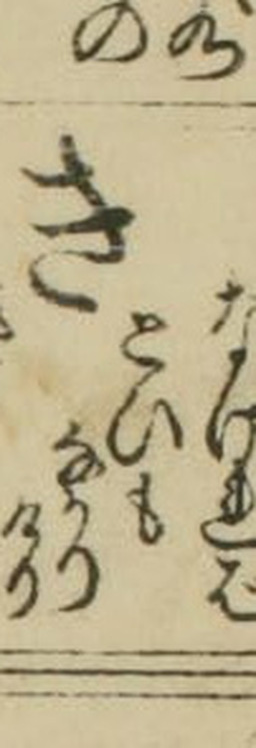なかり
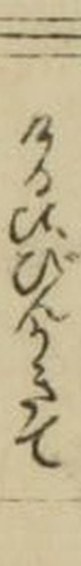ける比びんかきて
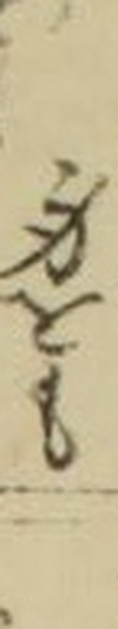身をも
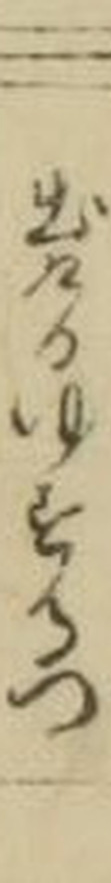出けるゆするつ
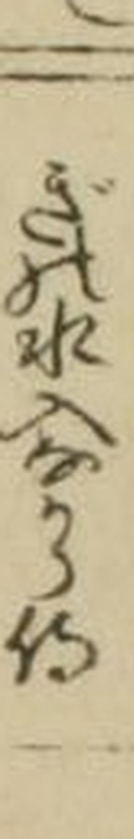ぎの水入なから侍
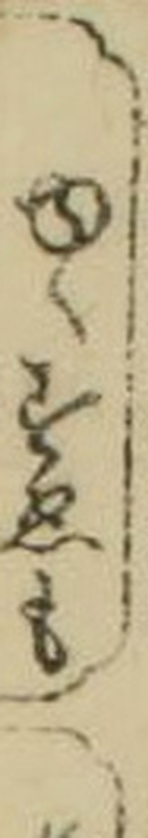ゆくすゑも
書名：女源氏教訓鑑
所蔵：東京学芸大学附属図書館
